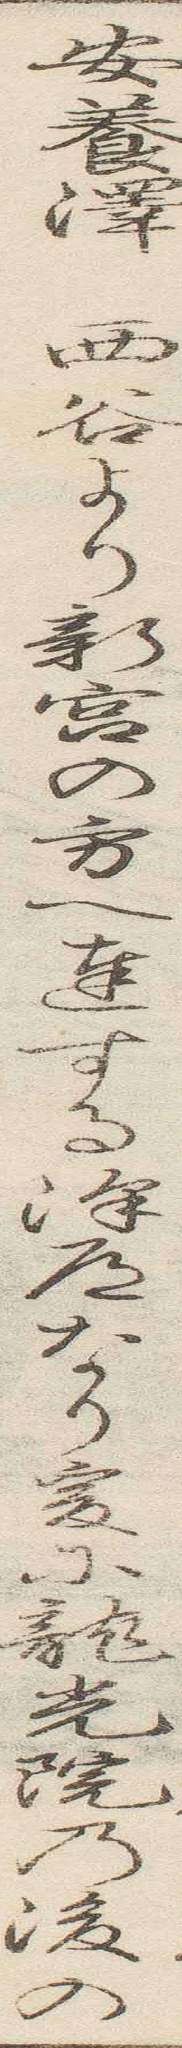安養澤西谷より新宮の方へ達する澤道なり爰に龍光院の後の
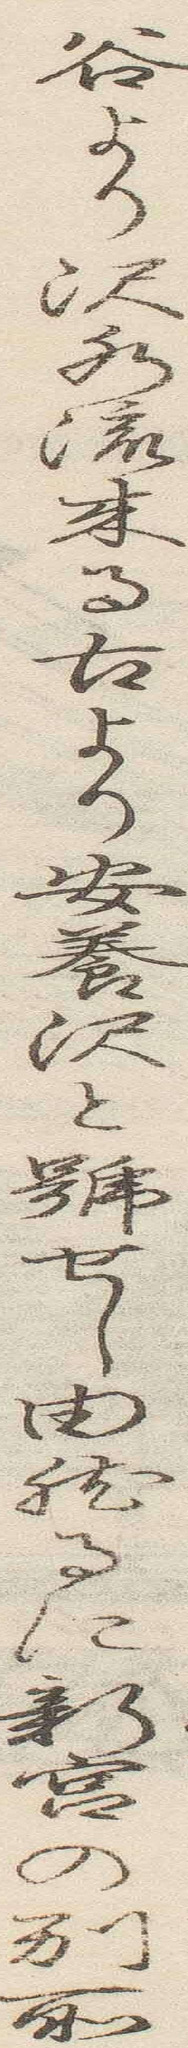谷より沢水流来る古より安養沢と號せし由然るに新宮の別所
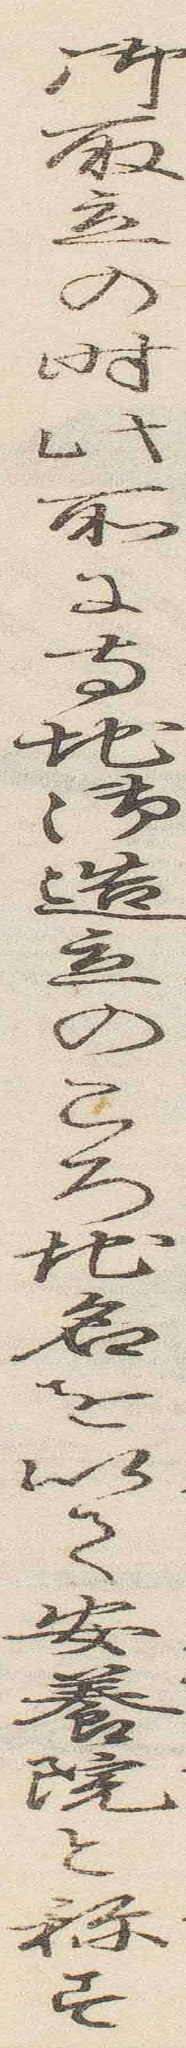御取立の时此所に寺地御造立のころ地名を以て安養院と称す
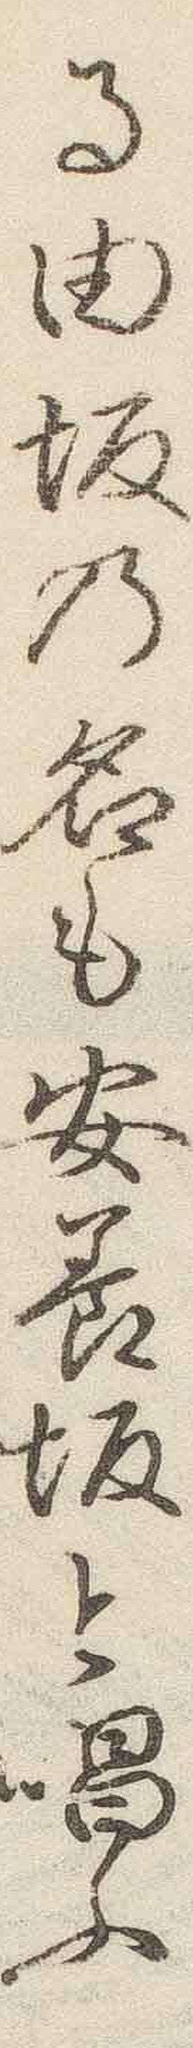る由坂の名も安養坂と唱ふ
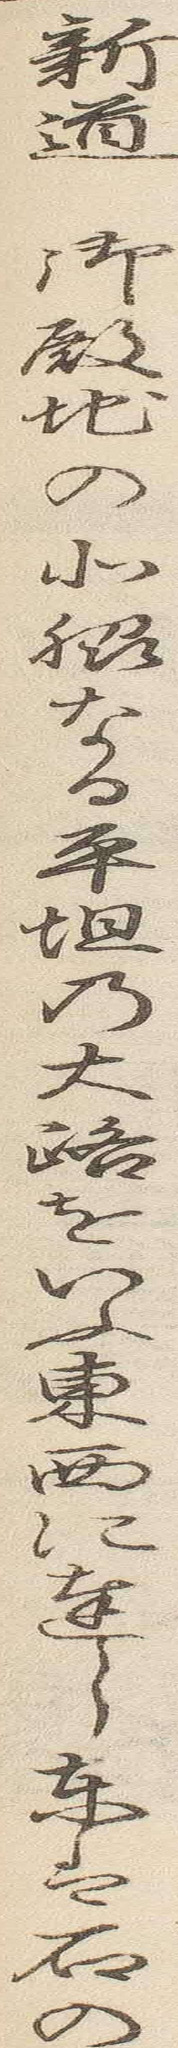新道御殿地の北脇なる平坦の大路をいふ東西に達し東は石の
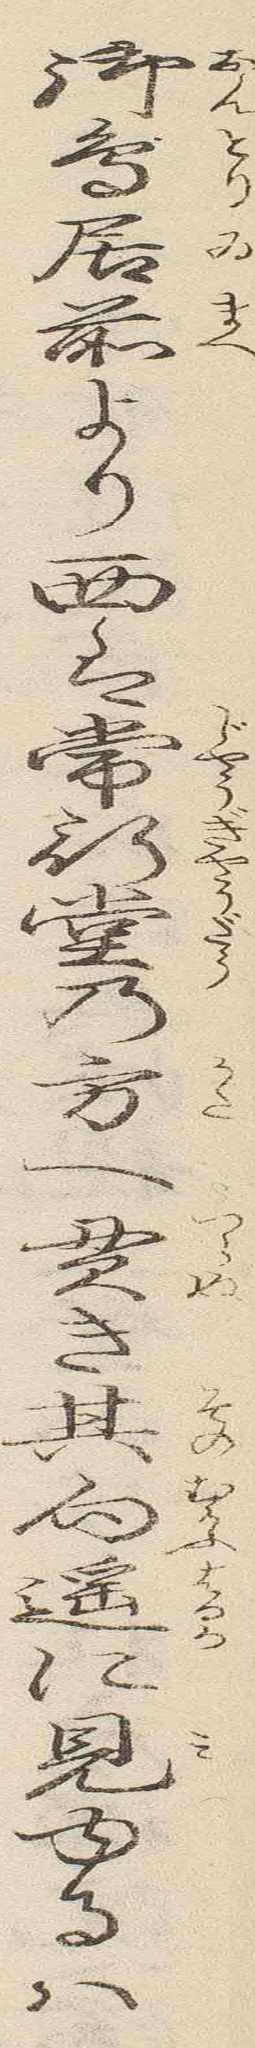御鳥居前より西は常行堂の方へ貫き其向遥に見ゆるは
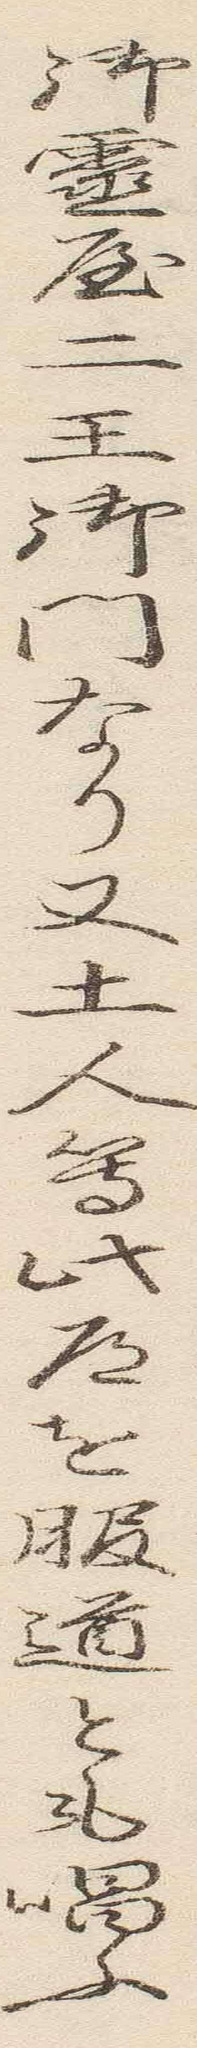御靈屋二王御門なり又土人等此道を服道とも唱ふ
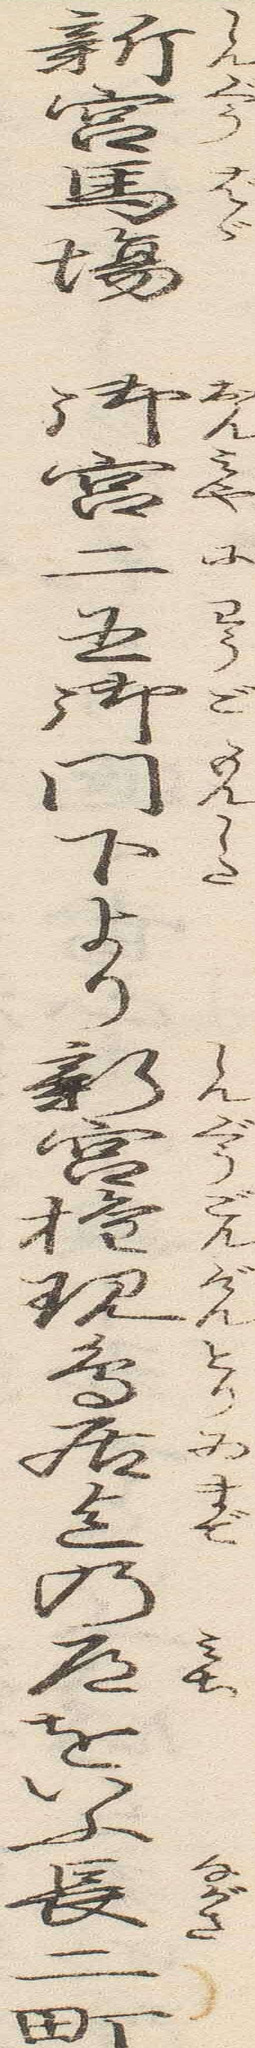新宮馬塲御宮仁王御門下より新宮権現鳥居迄の道をいふ長二町
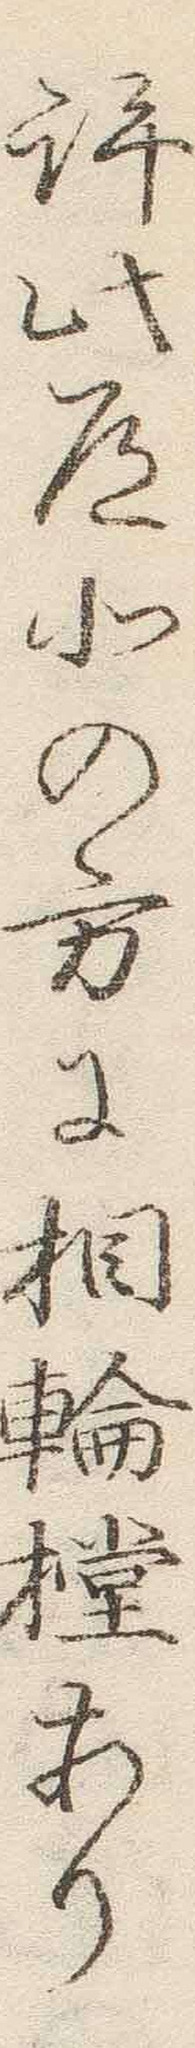許此道北の方に相輪摚あり
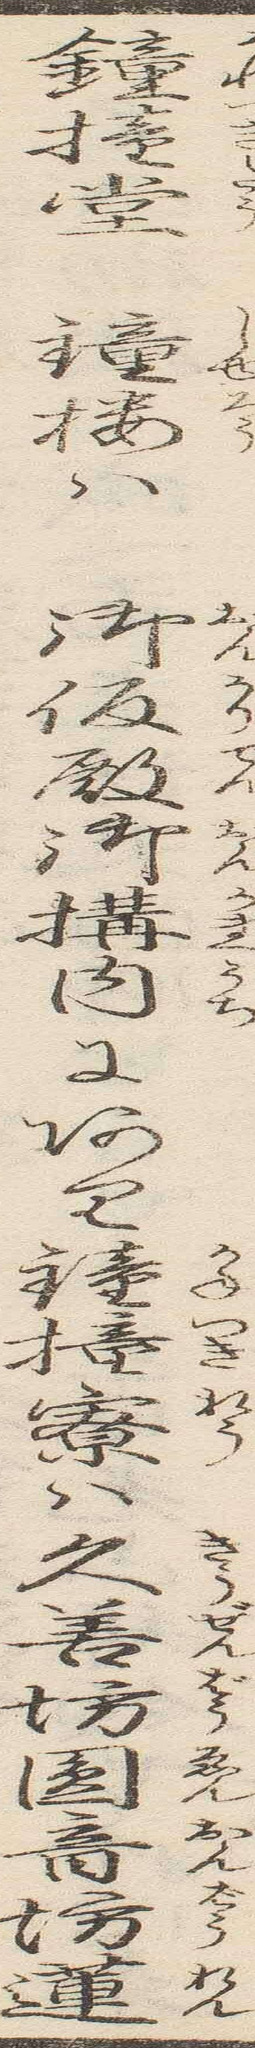鐘撞堂鐘楼は御仮殿御構内にあり鐘撞寮は久善坊圓音坊蓮
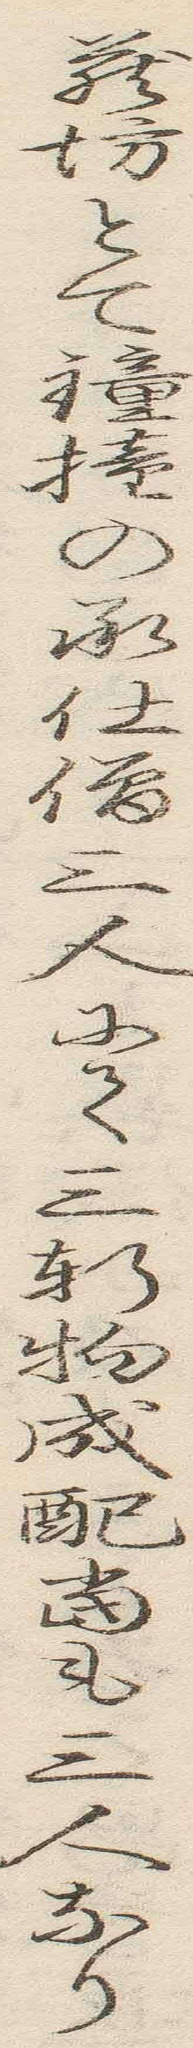蔵坊とて鐘撞の承仕僧三人にて三軒物成配當も三人なり
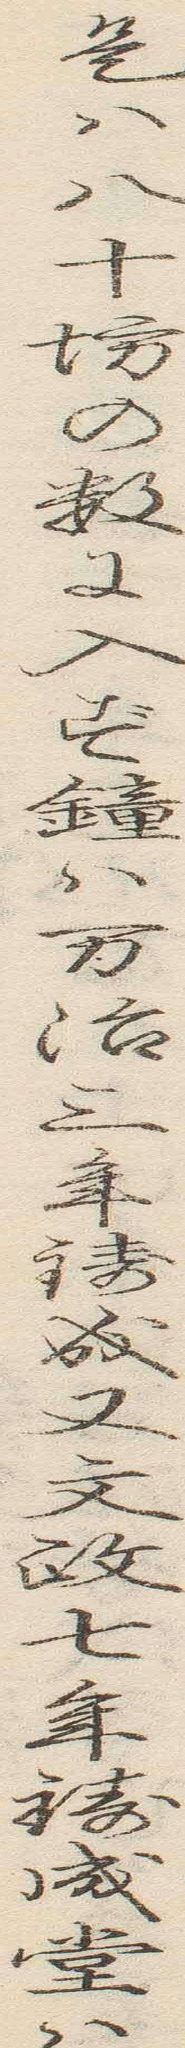是は八十坊の数に入ず鐘は万治三年鋳成又文政七年鋳成堂は
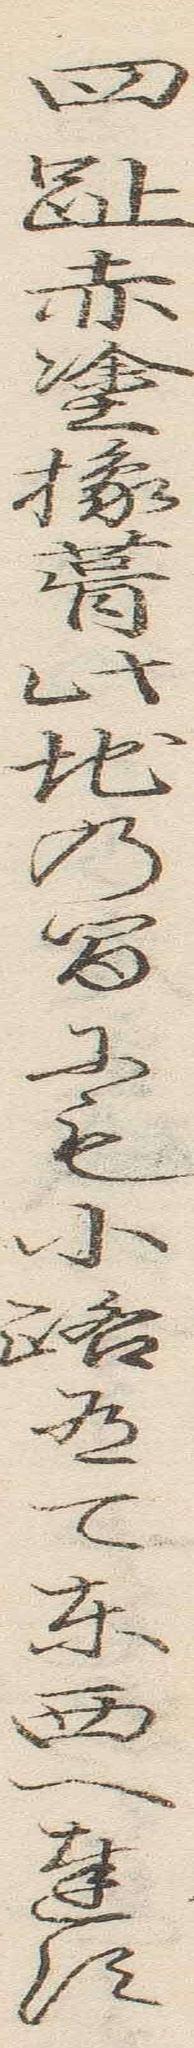四趾赤塗橡葺此地の間にも小路有て東西に達す
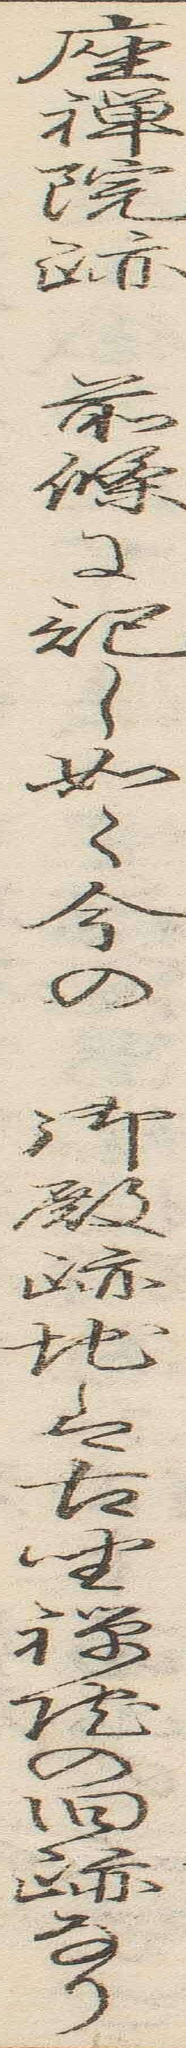座禅院跡前條に記し如く今の御殿跡地は古坐禅院の旧跡なり
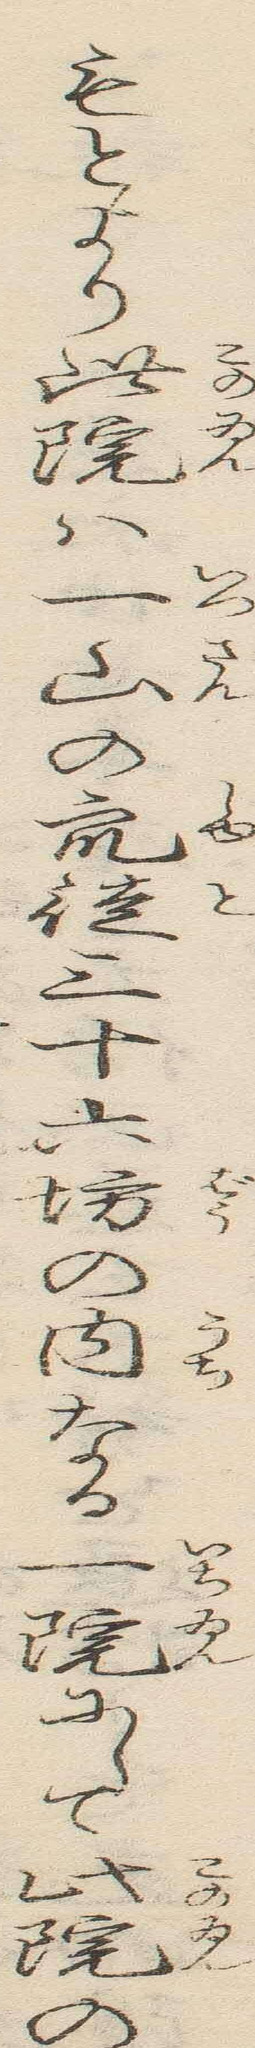もとより此院は一山の衆徒三十六坊の内なる一院にして此院の

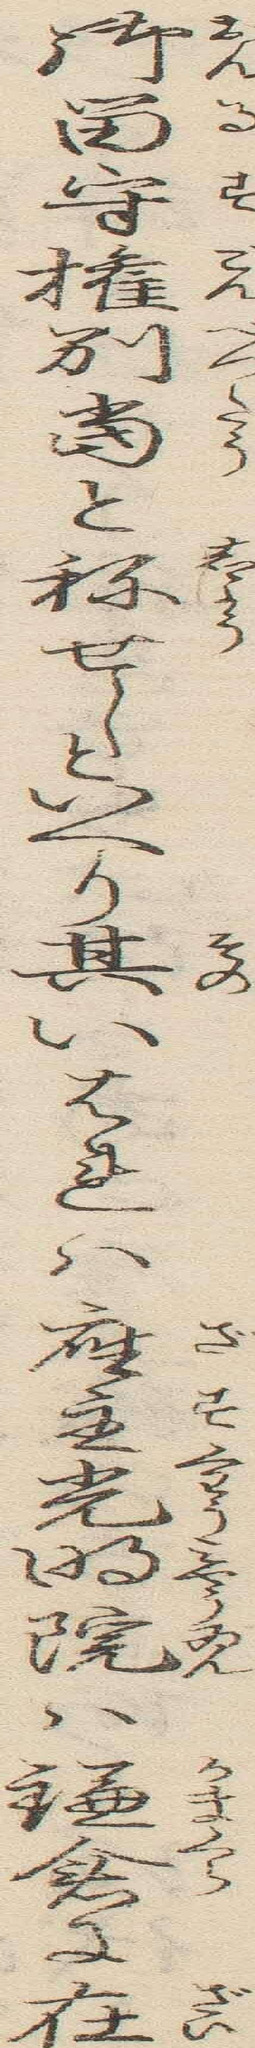御留守権別當と称せしといへり其いはれは座主光明院は鎌倉に在
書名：日光山志
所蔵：東京学芸大学附属図書館 国文学研究資料館
